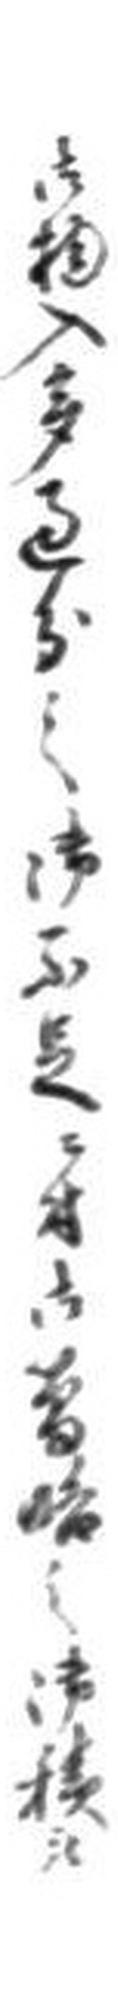御物入多過分之御不足ニ付御簡略之御積被
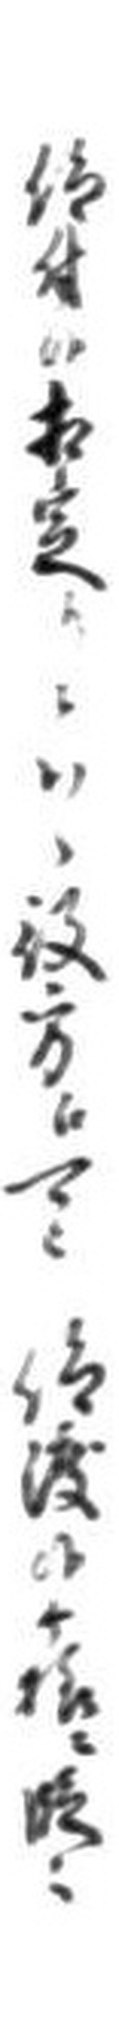仰付候相定り候ハヽ役方江可被仰渡候ケ様ニ段々
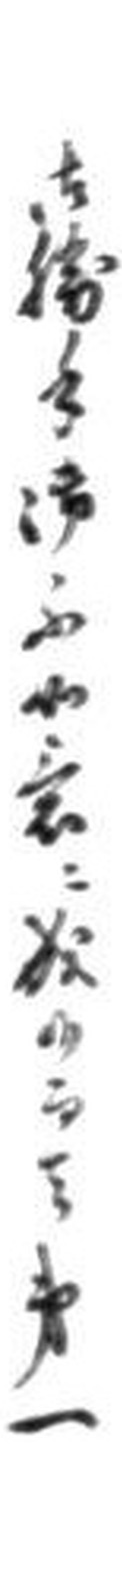御勝手御不如意ニ成候而者第一
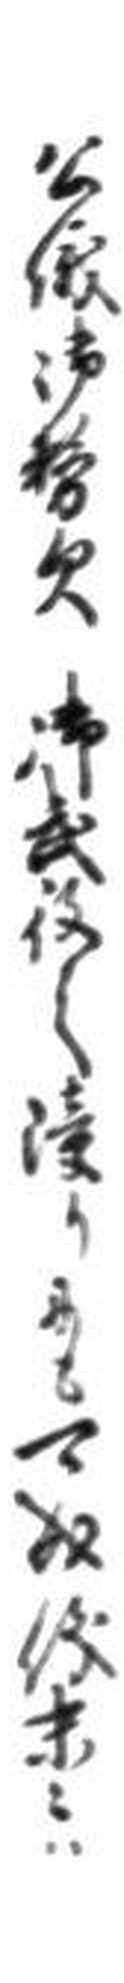公儀御務欠御武役之障りにも可成儀末々ハ
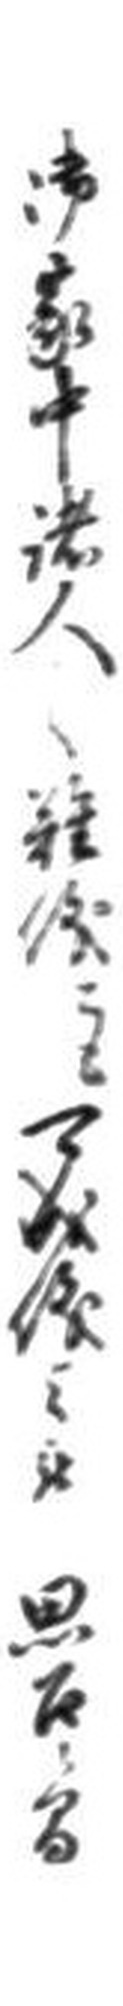御家中諸人之難儀ニも可成儀与被思召候間
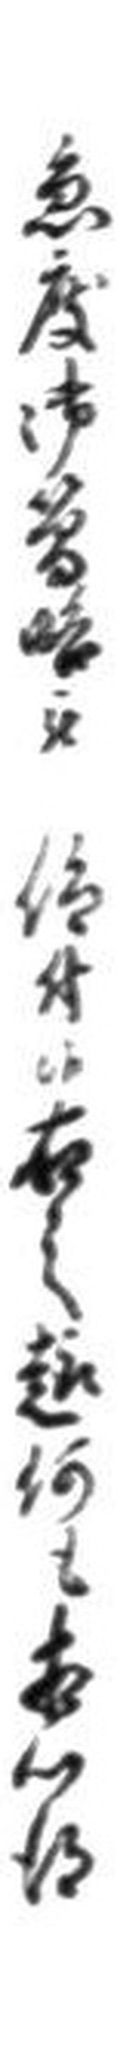急度御簡略被仰付候右之趣何も相心得

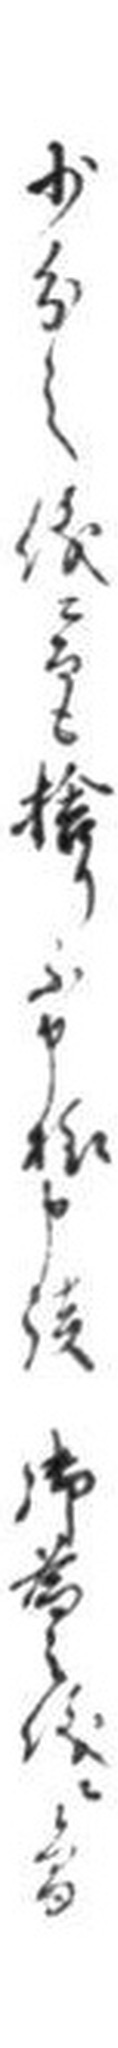少分之儀ニ而も捨り不申様申談御為之儀ニ候間
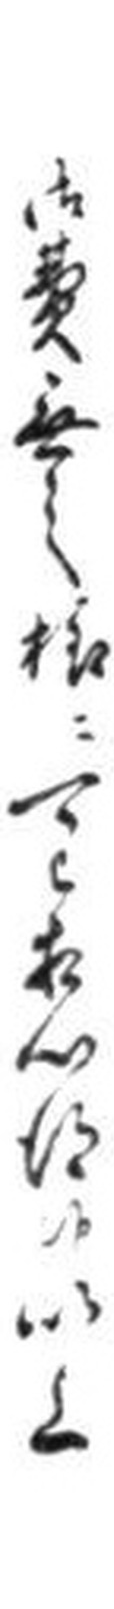御費無之様ニ可被相心得候以上
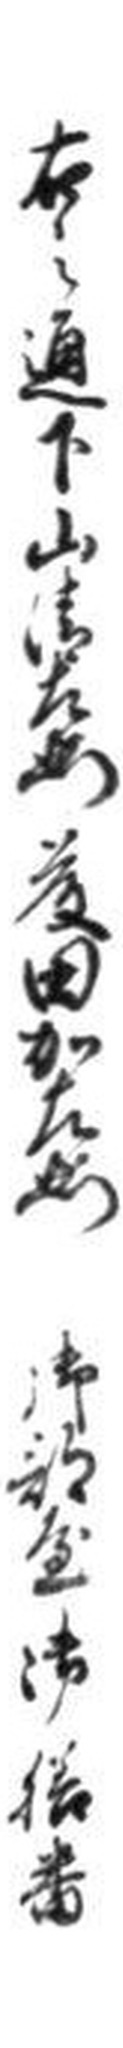右之通下山清左衛門藤田加左衛門御部屋御膳番
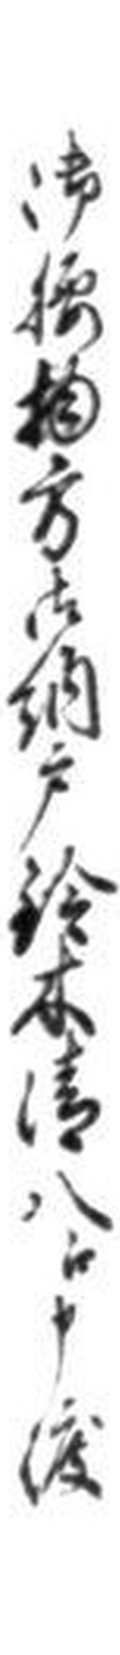御腰物方御納戸鈴木清八江申渡
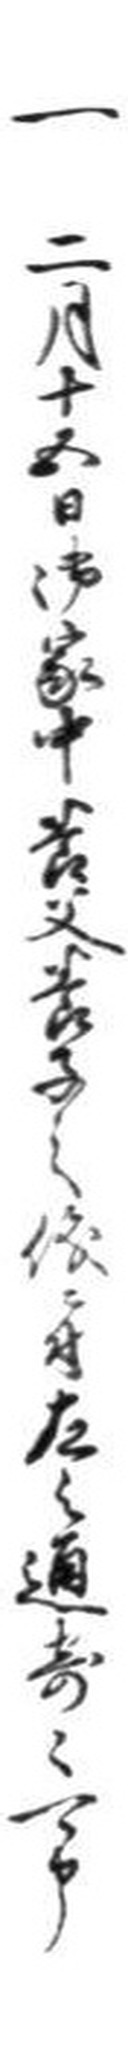一二月十五日御家中養父養子之儀ニ付左之通寄々可申
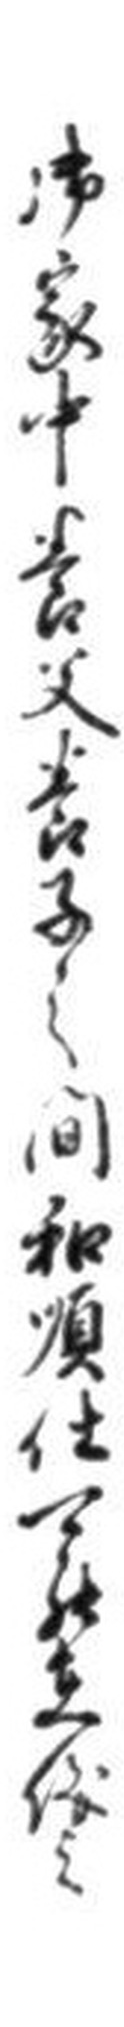御家中養父養子之間和順仕可罷在儀与
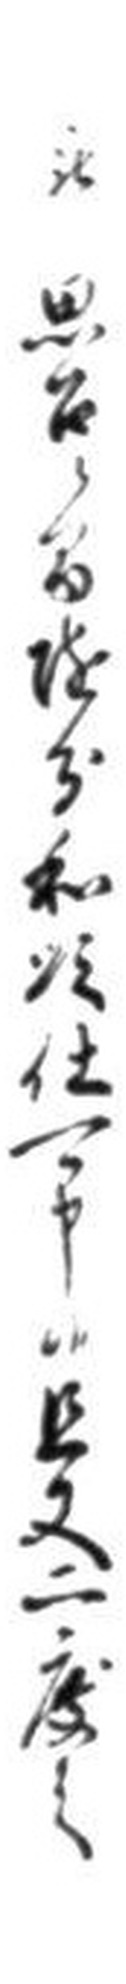被思召候間随分和順仕可申候且又二度之
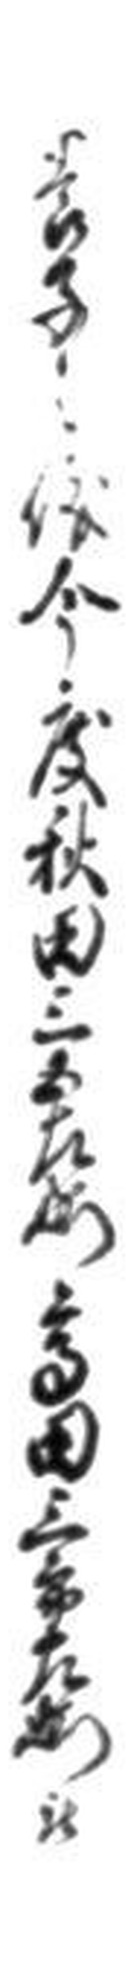養子之儀今度秋田三五左衛門高田三郎左衛門被
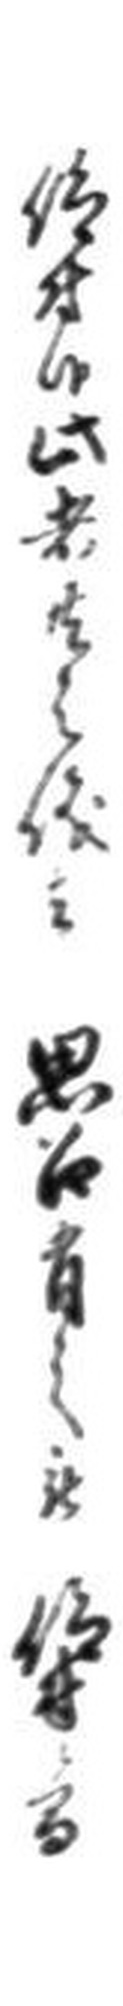仰付候此者共之儀者思召有之被仰付候間
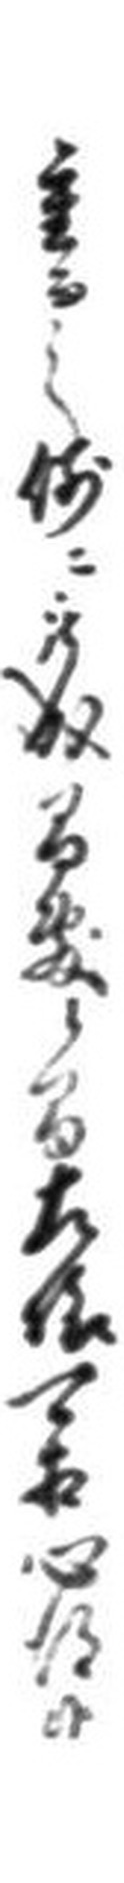重而之例ニ被成間敷候間左様可相心得候
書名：家譜 三十六 宗昌公 従享保八年到同九年
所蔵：福井県文書館 Fukui Prefectural Archives
